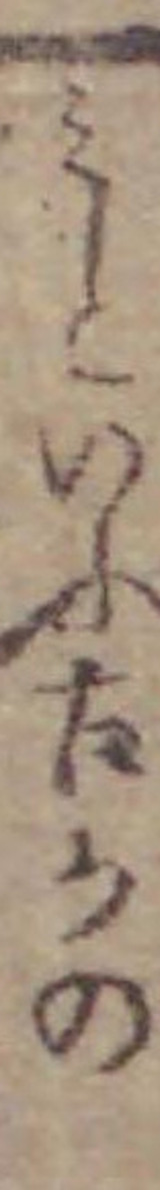みといふ古かの
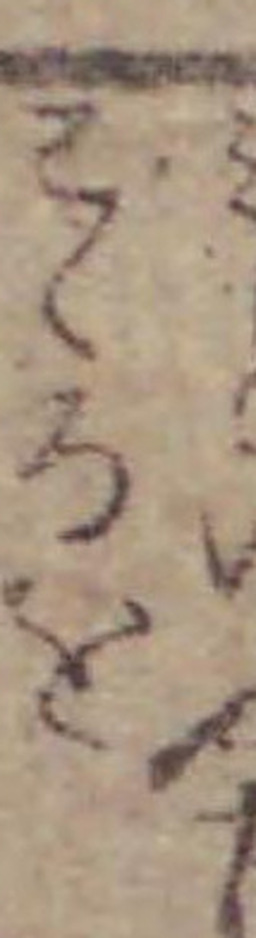こゝろを
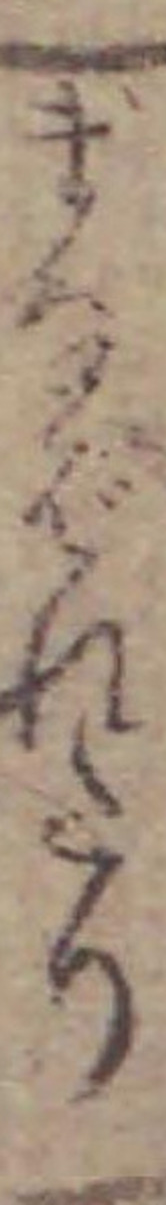まなばれたり
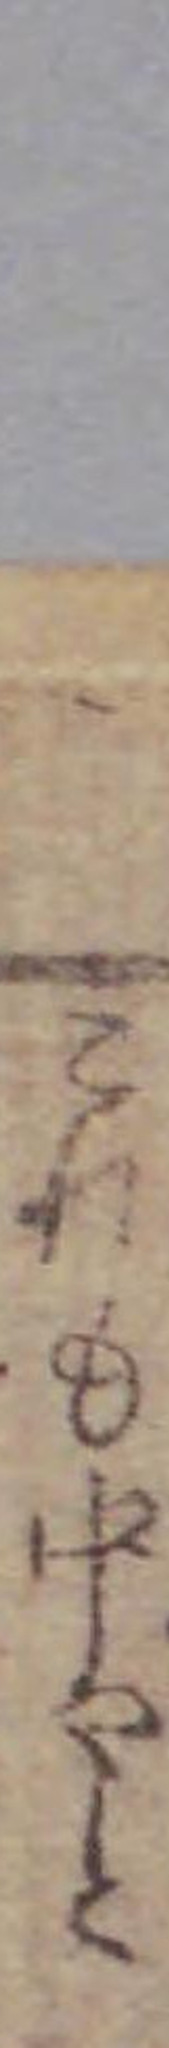これも中やと
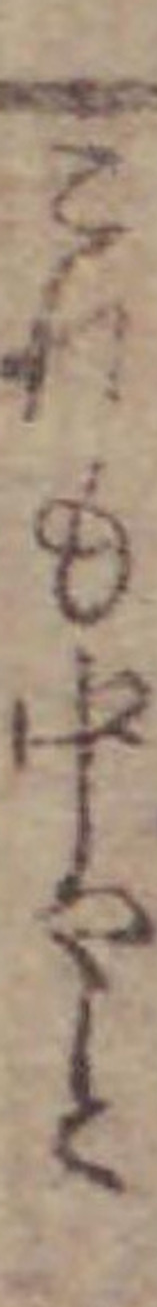これも中やと
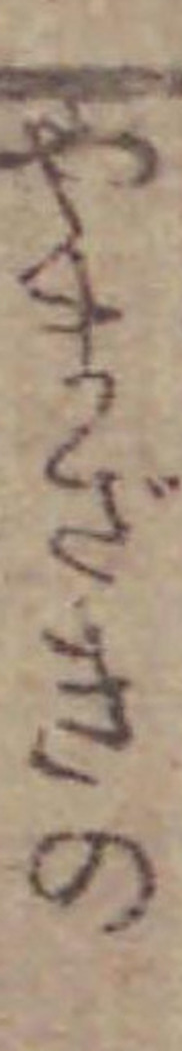やまざきの
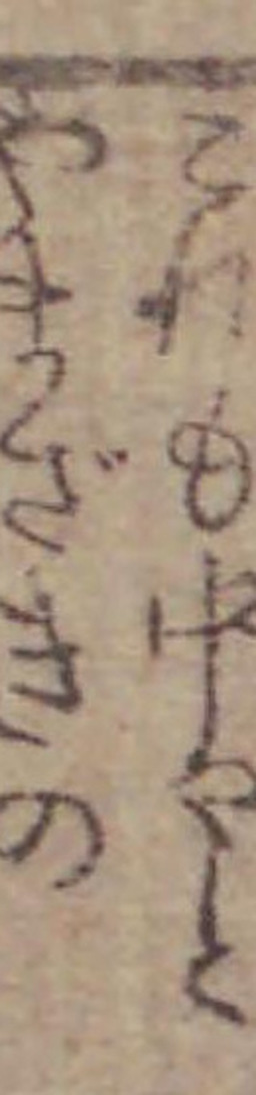やまざきの
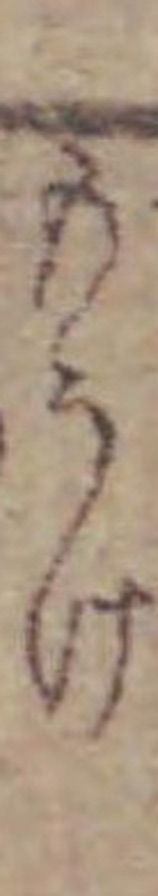もうけ

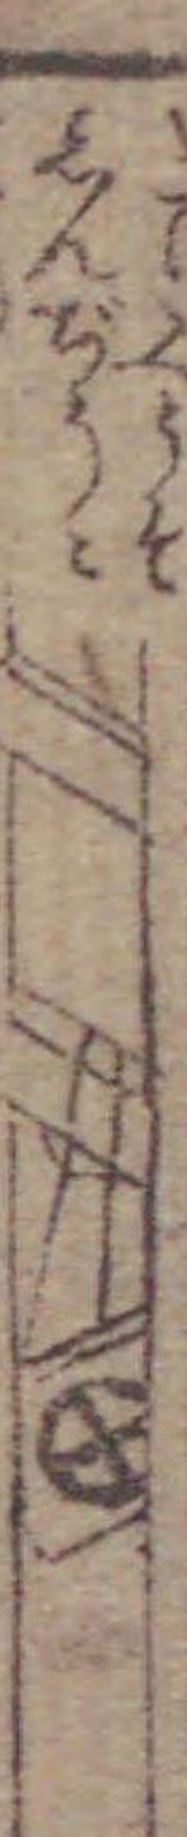しんぢうに
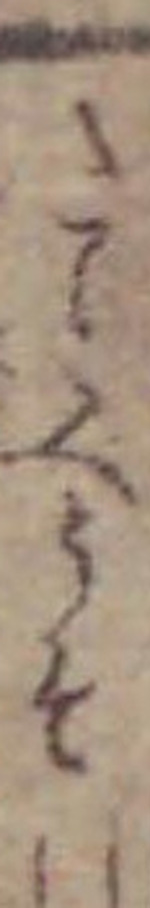たとへうそ
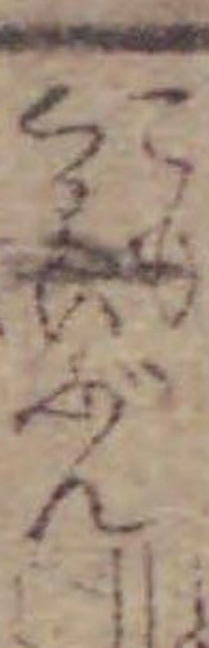くわいぶん
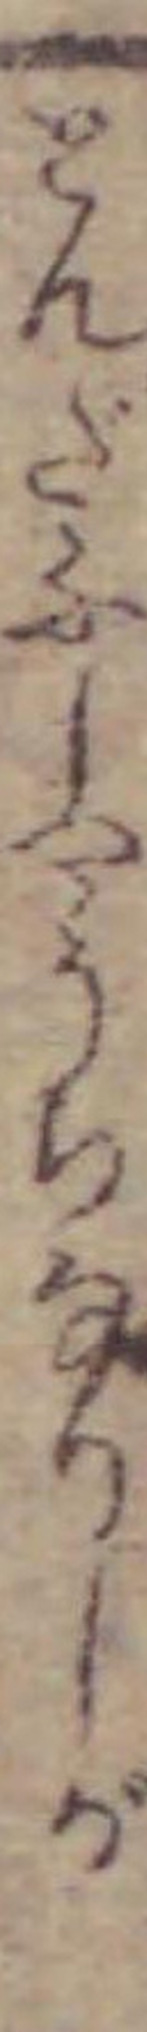とんだふしやうちなりしが
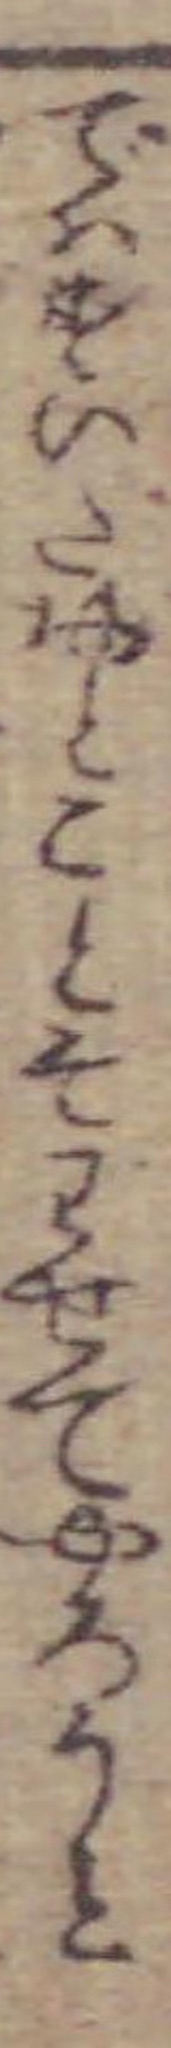ではすいたおとことそわせてやろうと
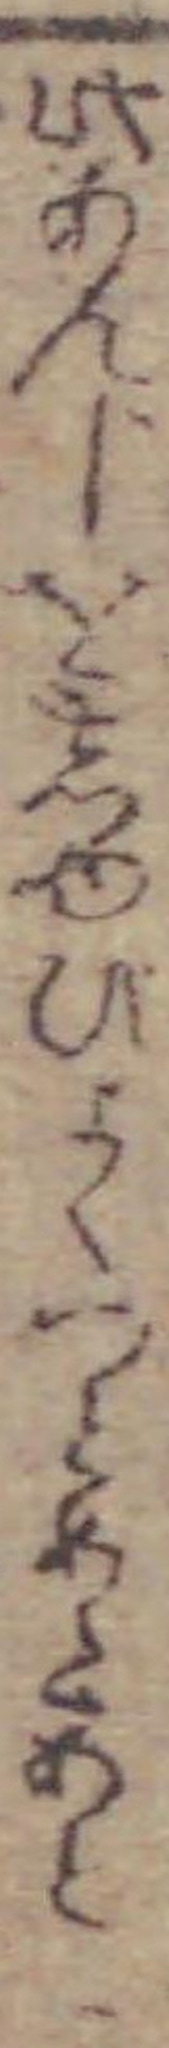此あんじをしゆびよくつとめたあと
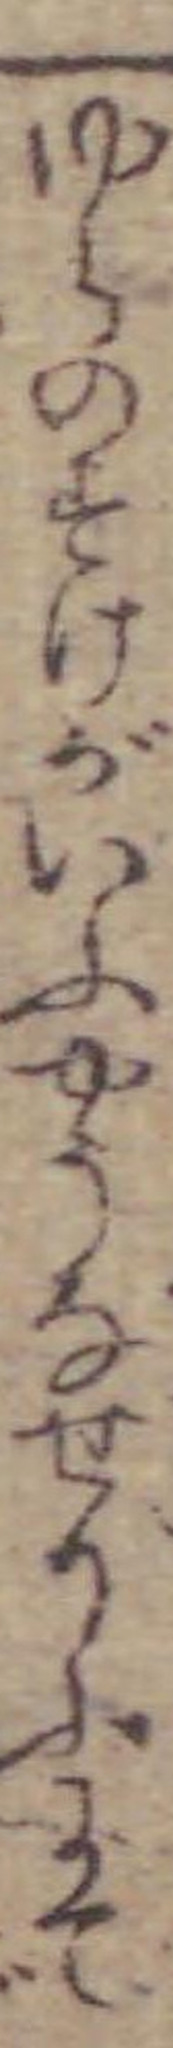ゆらのすけがいふやうなせりふにて
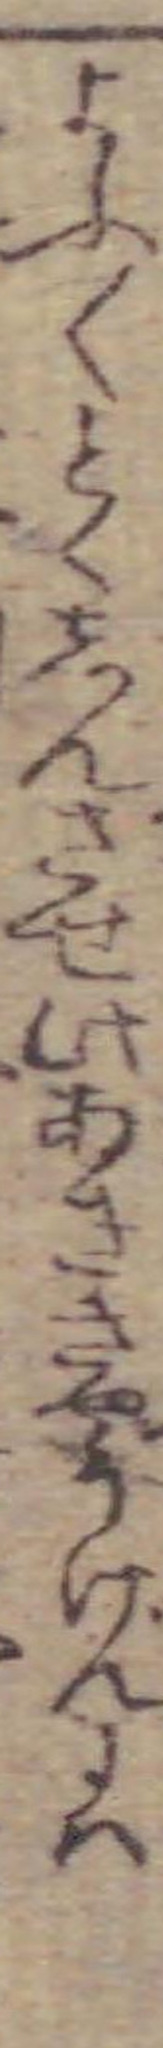よふ〳〵とくしんさせ此あききやうげんには
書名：江戸生艶気樺焼 : 3巻
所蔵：国立国会図書館 National Diet Library, JAPAN
